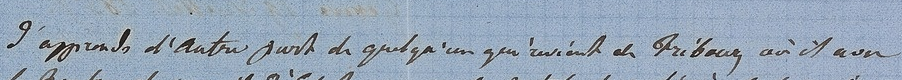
J'apprends d'autre part de quelqu'un qui revient de Fribourg où il a vu
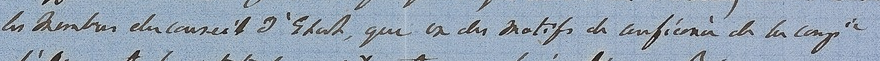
les membres du conseil d'Etat, que un des motifs de confirmer de la compie
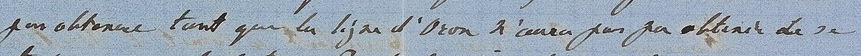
pas obtenue tant que la ligne d'Oron n'aura pas pu obtenir de se
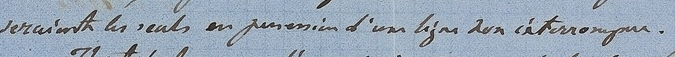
seraient les seuls en possession d'une ligne non interrompue.
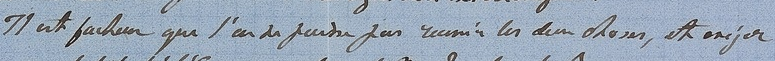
Il est facheux que l'on ne puisse pas reunir les deux choses, et exiger
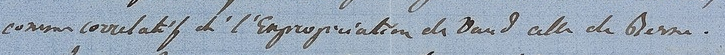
comme correlatif de l'Expropriation de Vaud celle de Berne.
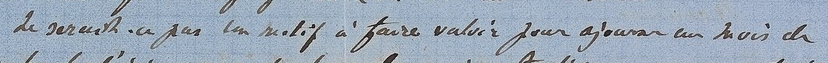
Le serait-ce pas un motif à faire valoir pour ajourner au mois de
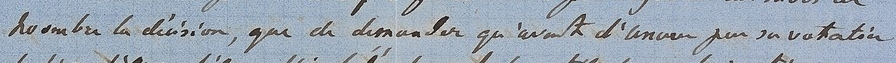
Novembre la décision, que de demander qu'avant d'ancrer par sa votation
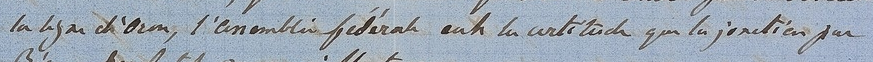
la ligne d'Oron, l'assemblée fédérale eut la certitude que la jonction par
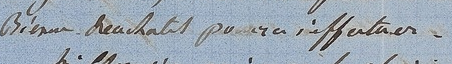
Bienne–Neuchatel pourra s'effectuer.
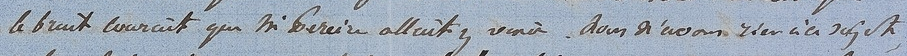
le bruit courait que M. Pereira allait y venir. Nous n'avons rien à ce sujet,
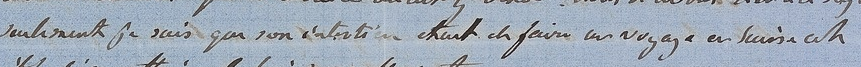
seulement je sais que son intention était de faire un voyage en Suisse cet
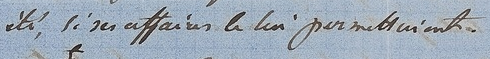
été, si ses affaires le lui permettaient.
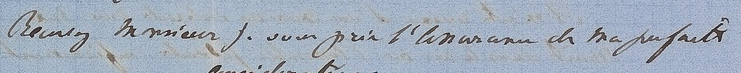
Recevez, Monsieur, je vous prie l'assurance de ma parfaite
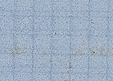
Votre
